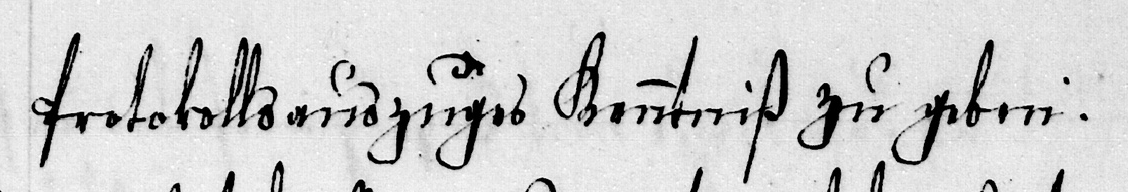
Protokollsauszuges Kenntniß zu geben.
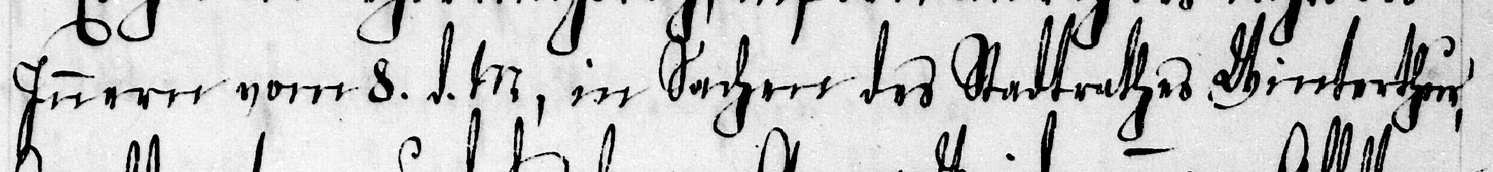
Innern vom 8. d. M., in Sachen des Stadtrathes Winterthur,
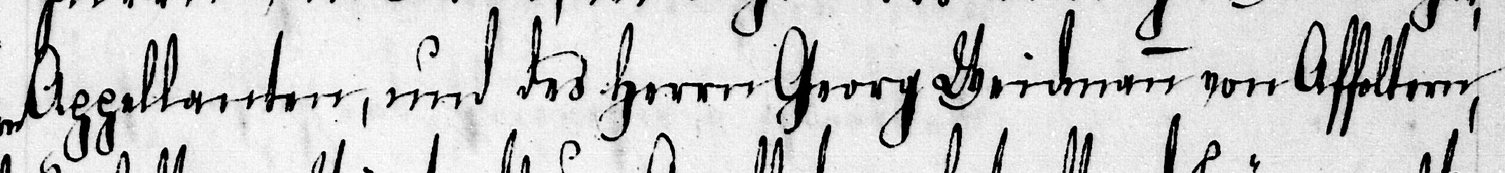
Appellanten, und des Herrn Georg Weidmann von Affolte¬
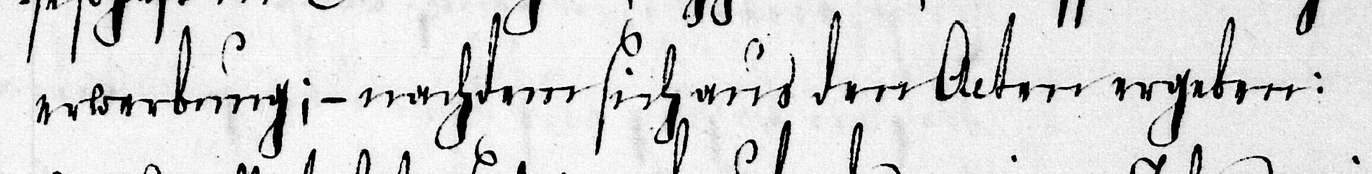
erwerbung; – nachdem sich aus den Acten ergeben:
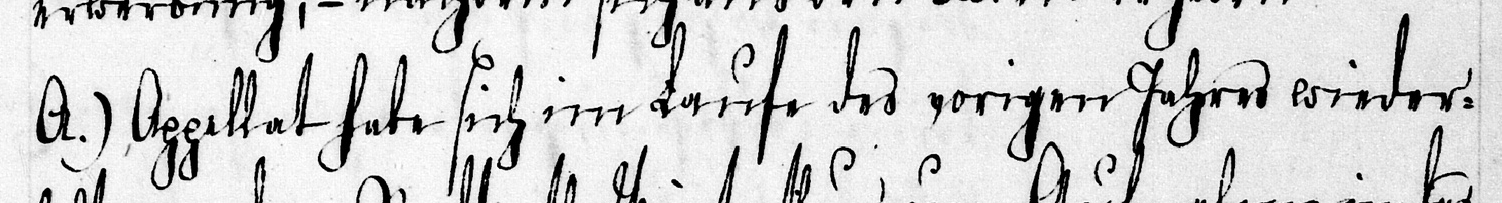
A.) Appellat habe sich im Laufe des vorigen Jahres wieder¬
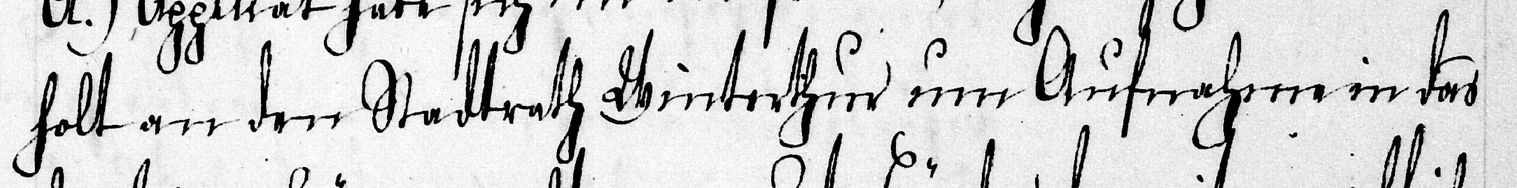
holt an den Stadtrath Winterthur um Aufnahme in das
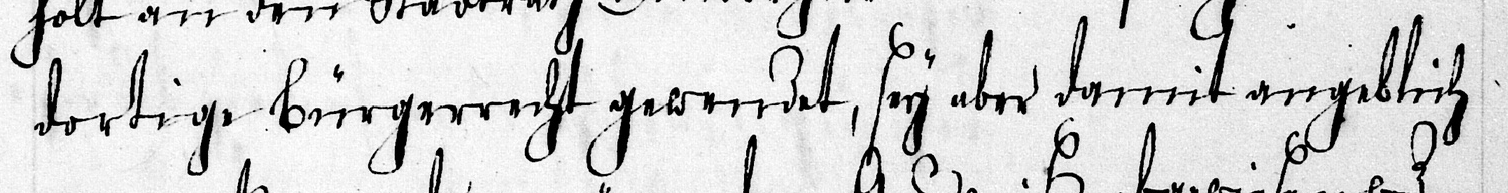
dortige Bürgerrecht gewendet, sey aber damit angeblich
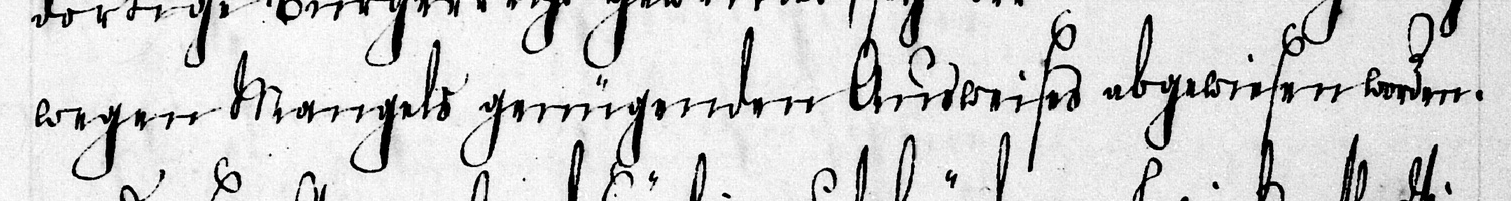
wegen Mangels genügenden Ausweises abgewiesen worden.
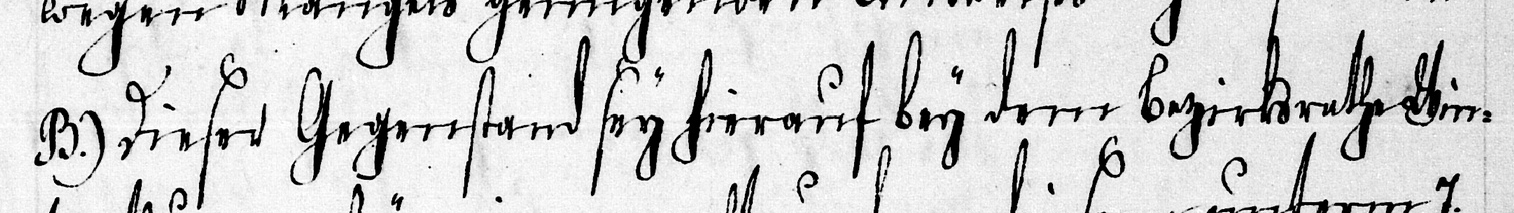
B.) Dieser Gegenstand sey hierauf bey dem Bezirksrathe Wi¬
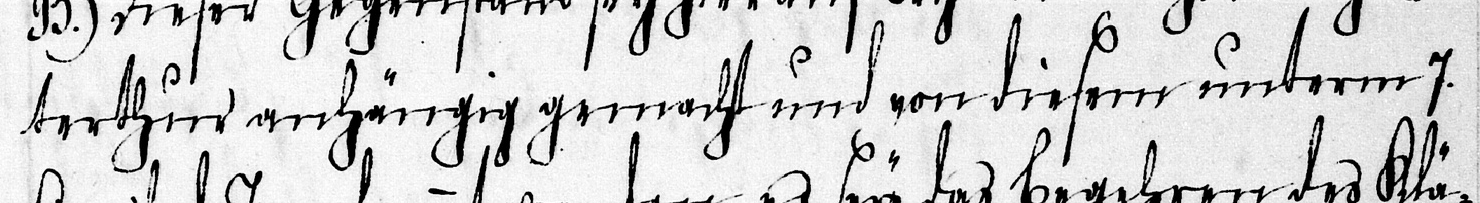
nterthur anhängig gemacht und von diesem unterm 7.
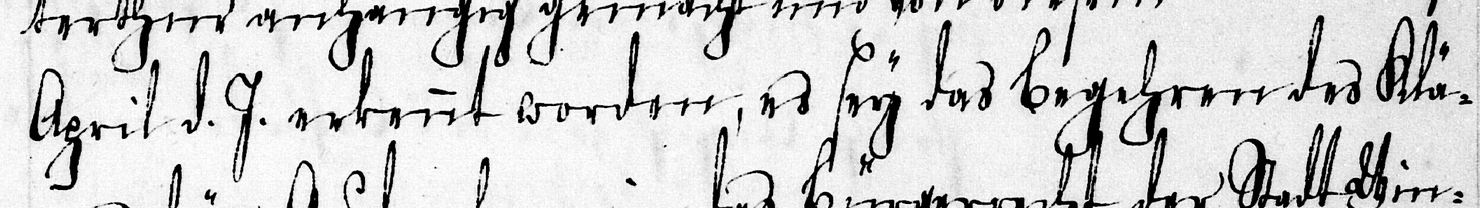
April d. J. erkennt worden, es sey das Begehren des Klä¬
